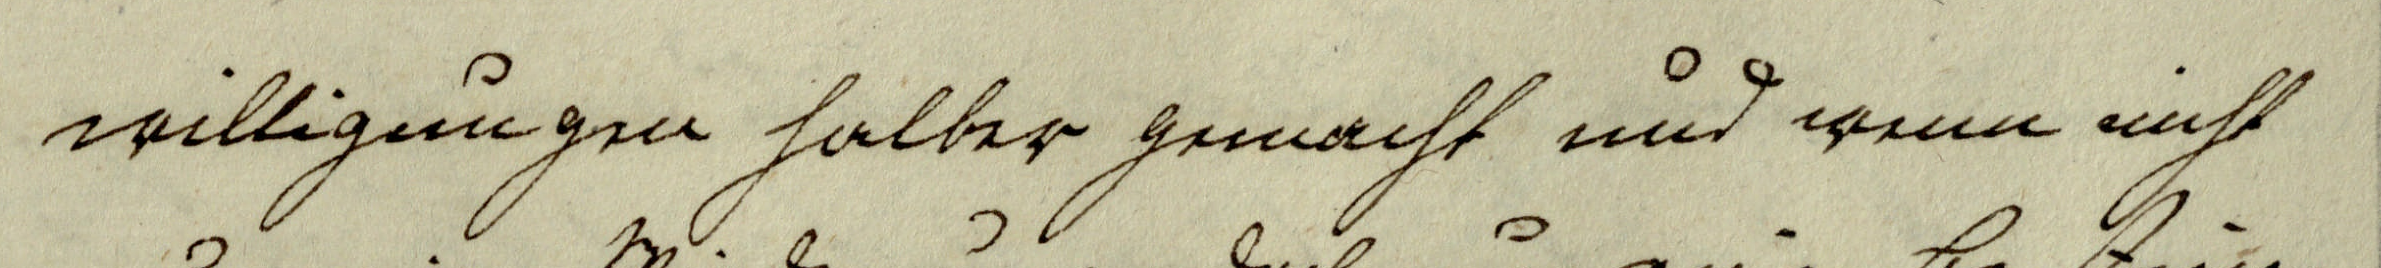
willigungen halber gemacht und wenn nicht
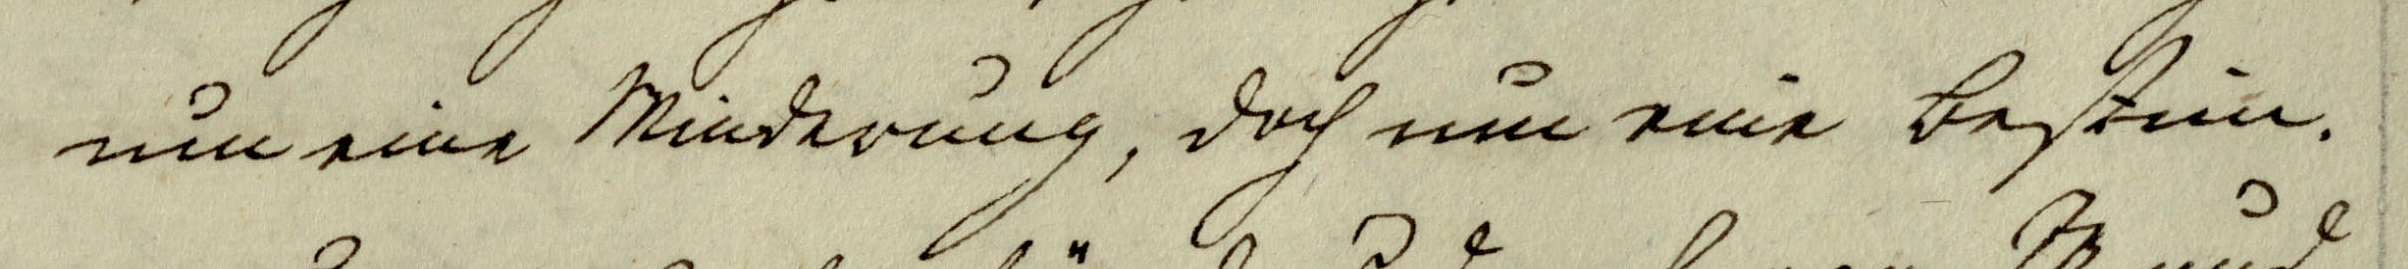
um eine Minderung, doch um eine Bestim¬
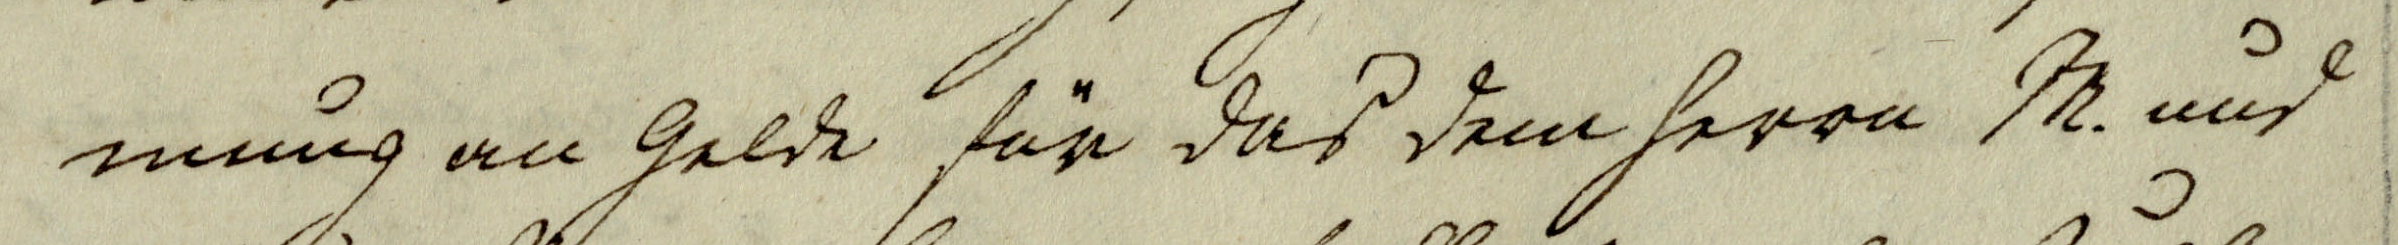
mung an Gelde für das dem Herrn M. und
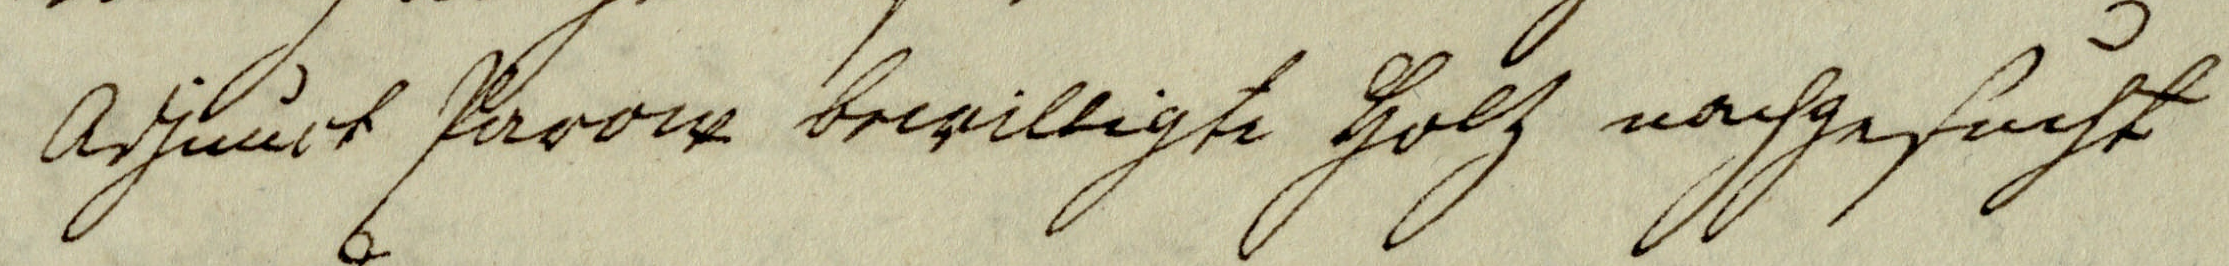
Adjunct Parow bewilligte Holz nachgesucht
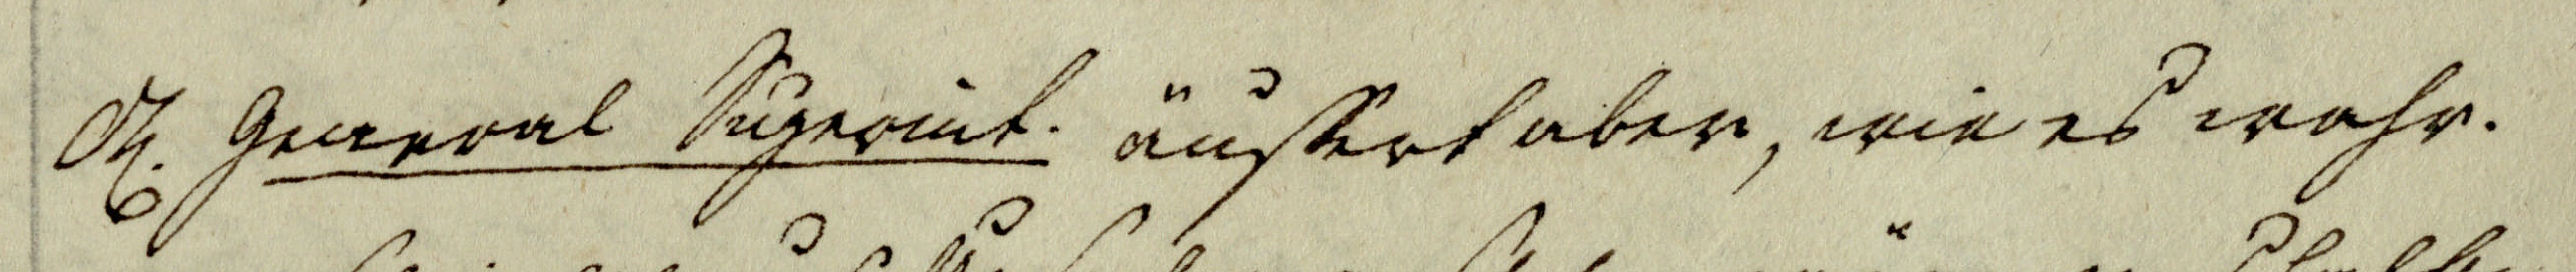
dh. General Superint. äussert aber, wie es wahr¬
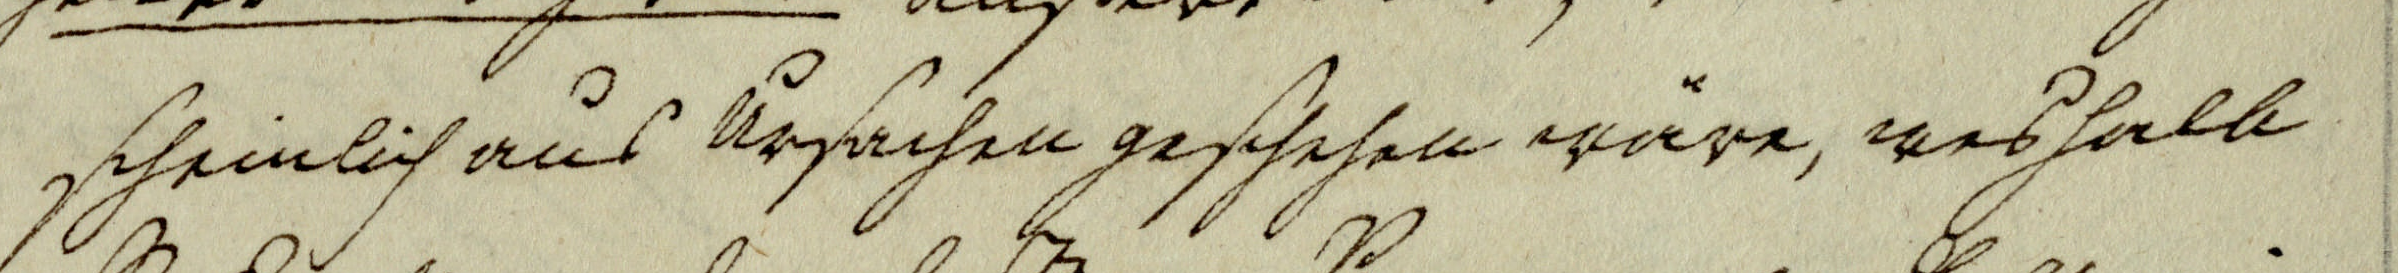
scheinlich aus Ursachen geschehen wäre, weshalb
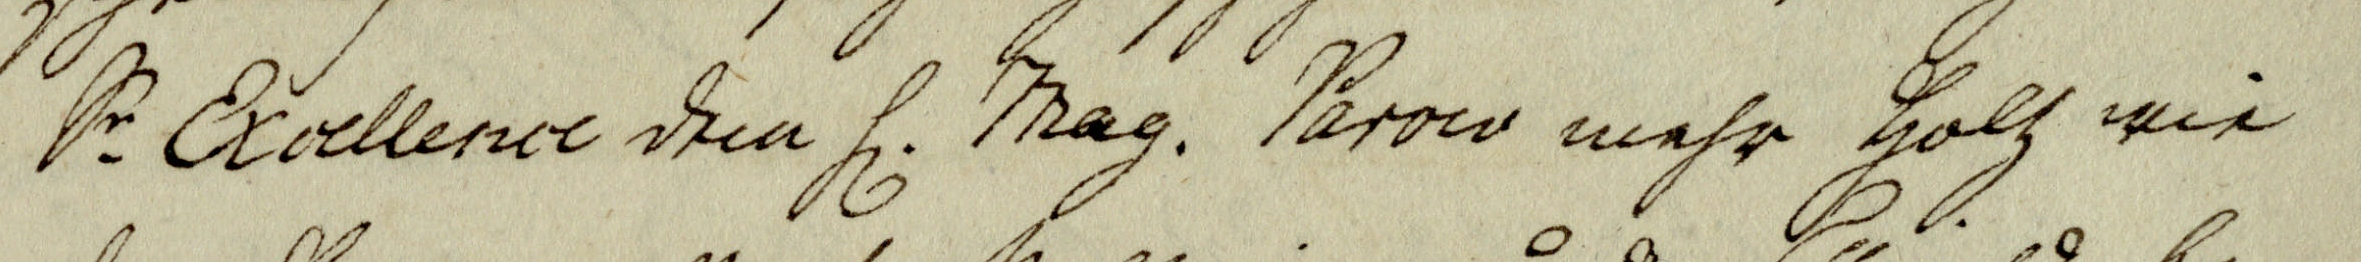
Sr Excellence dem H. Mag. Parow mehr Holz wie
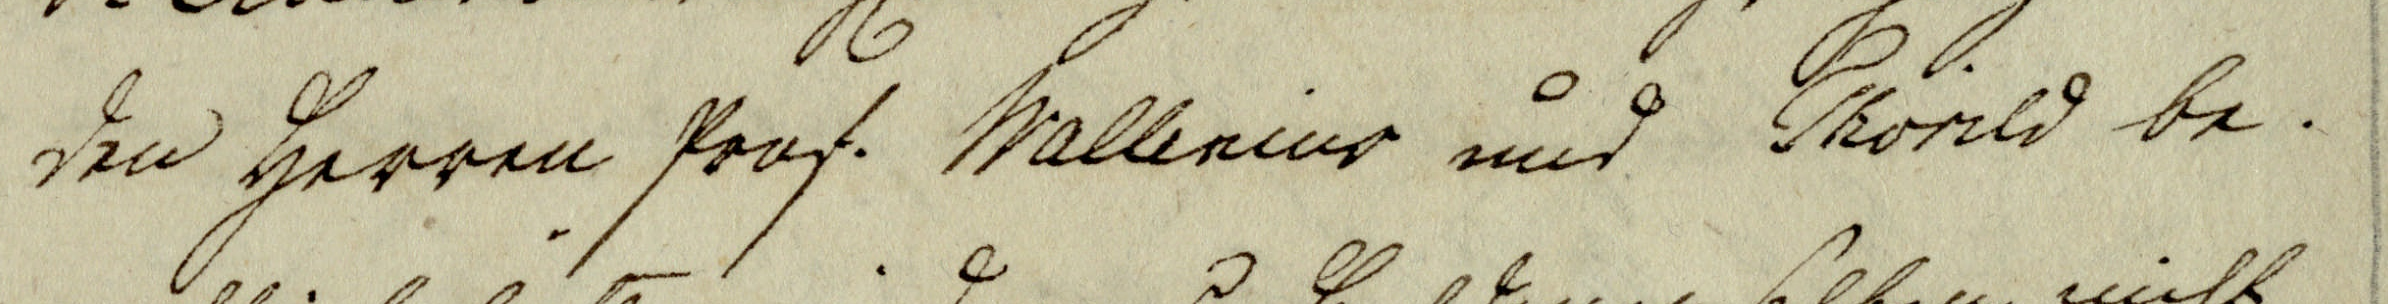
den Herren Prof. Wallenius und Thorild be¬
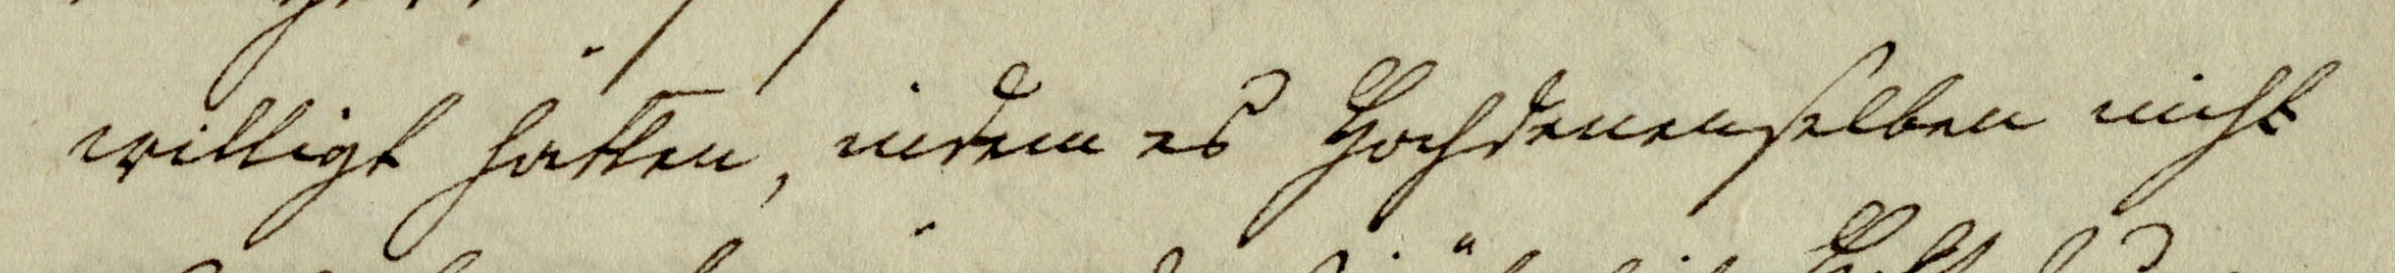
wiligt hätten, indem es Hochdenenselben nicht
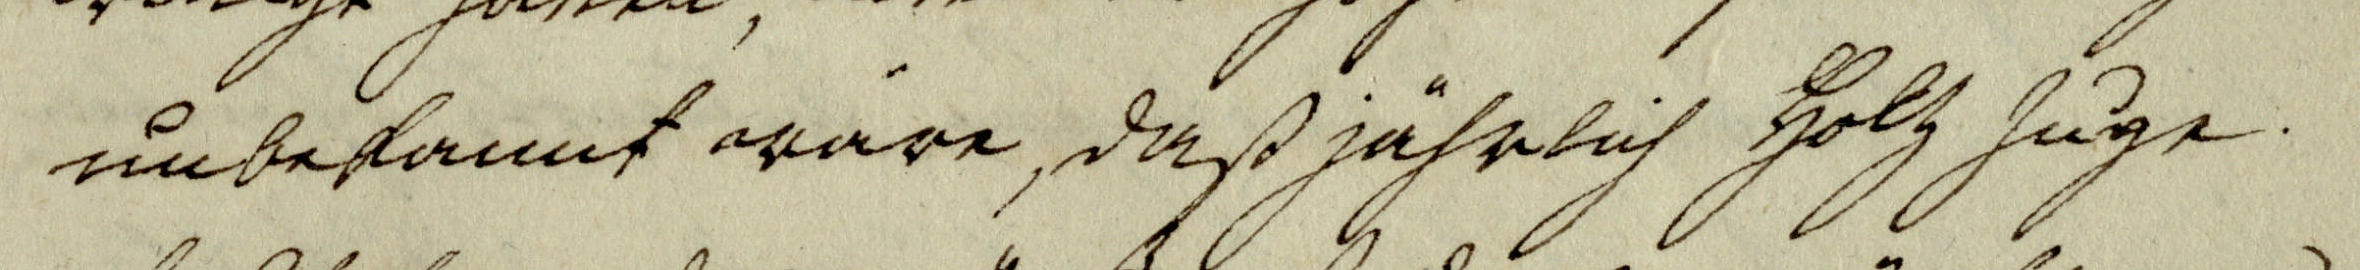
unbekannt wäre, daß jährlich Holz zuge¬
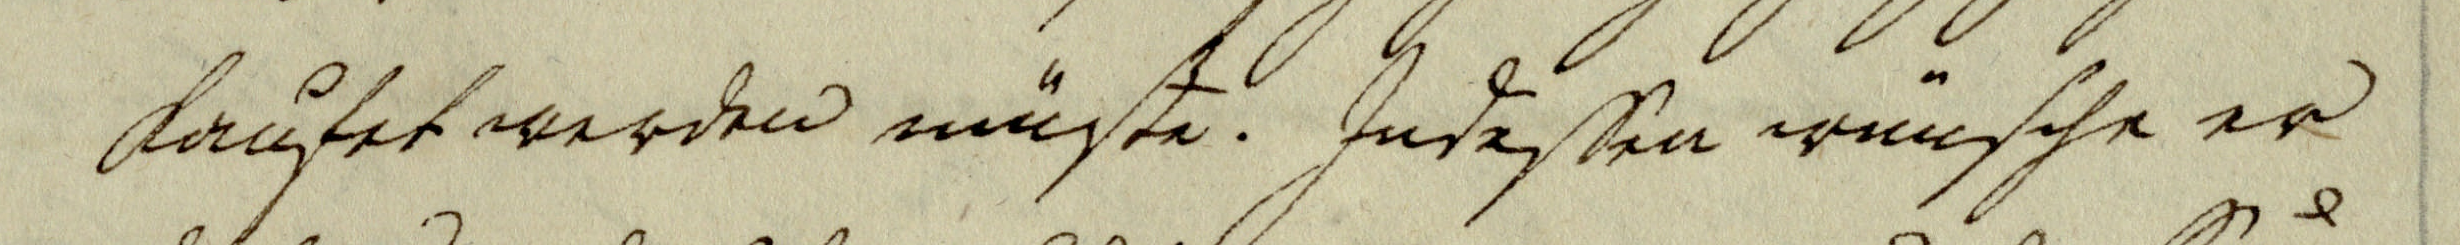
kaufet werden müßte. Indessen wünsche er
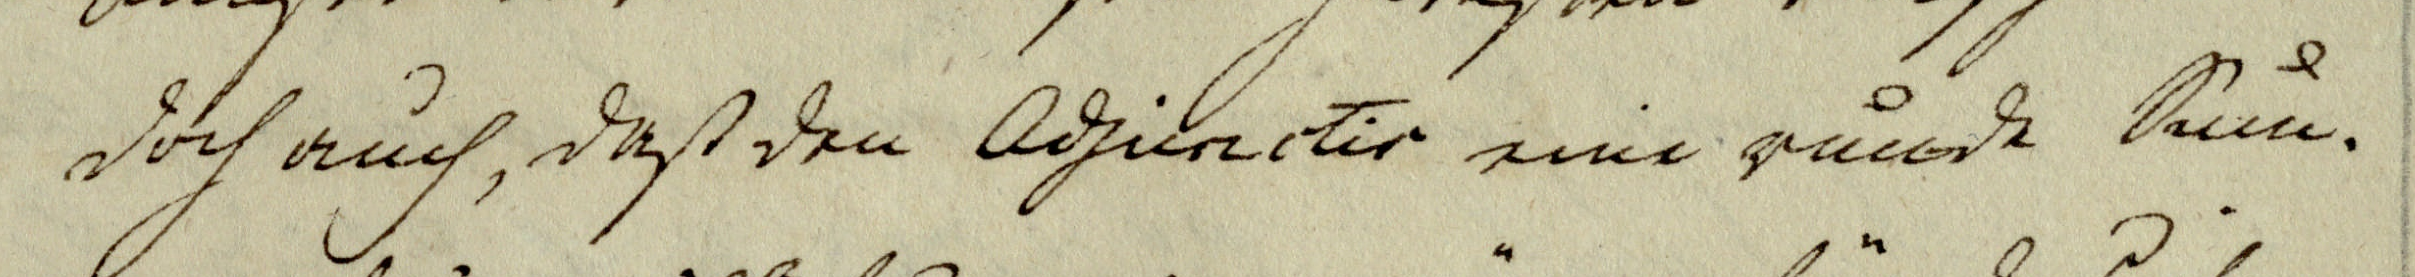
doch auch, daß den Adjunctis eine runde Sum¬
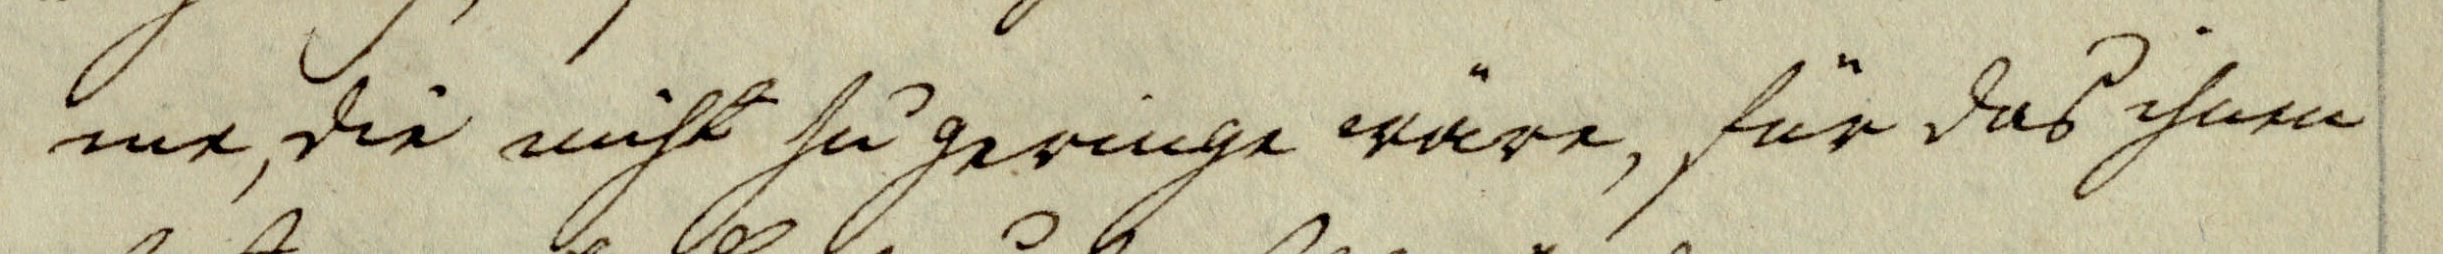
me, die nicht zu geringe wäre, für das ihnen
